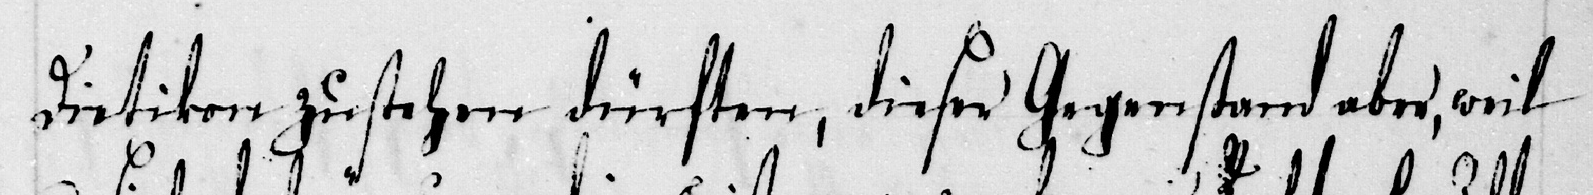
Dietikon zustehen dürften, dieser Gegenstand aber, weil
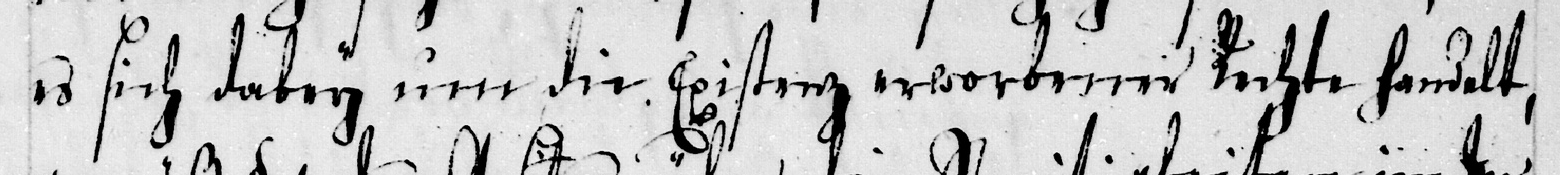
es sich dabey um die Existenz erworbener Rechte handelt,
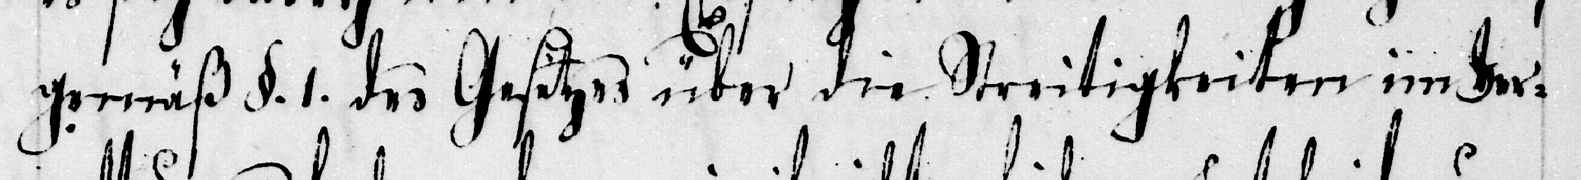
gemäß §. 1. des Gesetzes über die Streitigkeiten im Ver¬
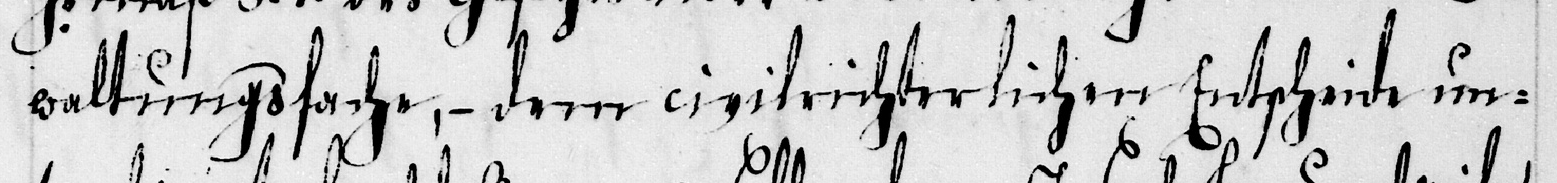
waltungsfache, – dem civilrichterlichen Entscheide un¬
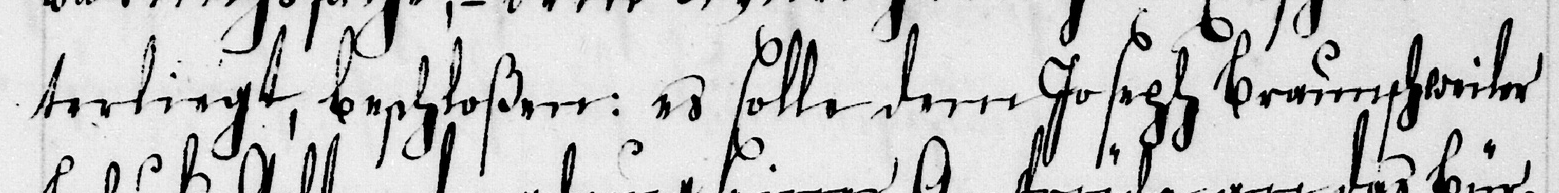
terliegt, beschloßen: es solle dem Joseph Braunschweiler
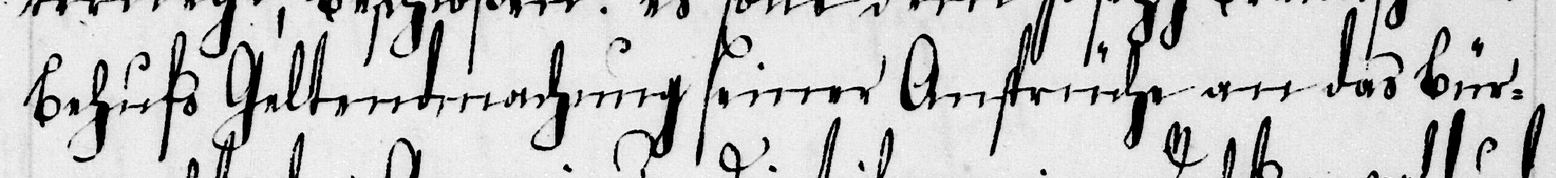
Behufs Geltendmachung seiner Ansprüche an das Bür¬
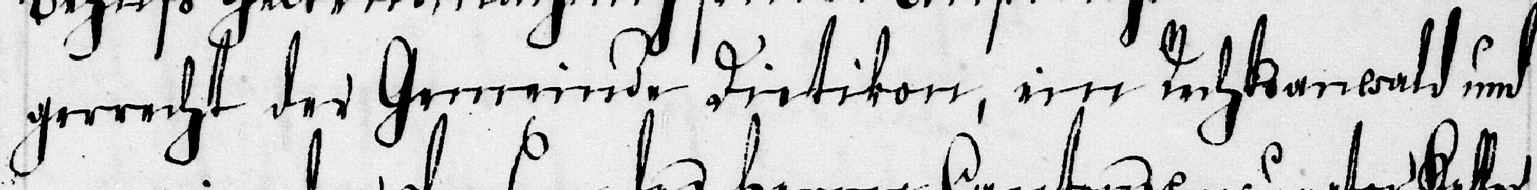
gerrecht der Gemeinde Dietikon, ein Rechtsanwald und
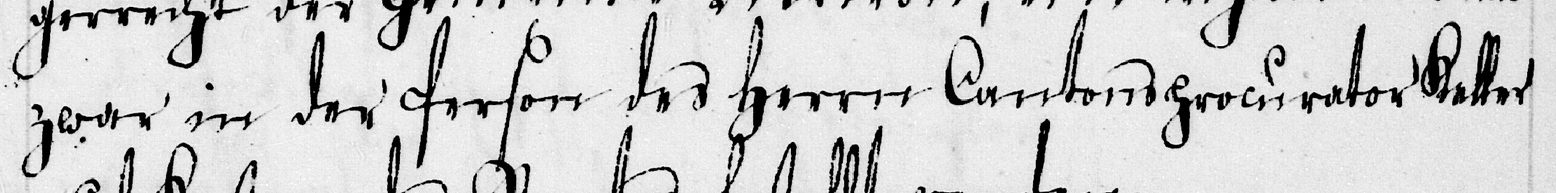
zwar in der Person des Herrn Cantonsprocurator Keller
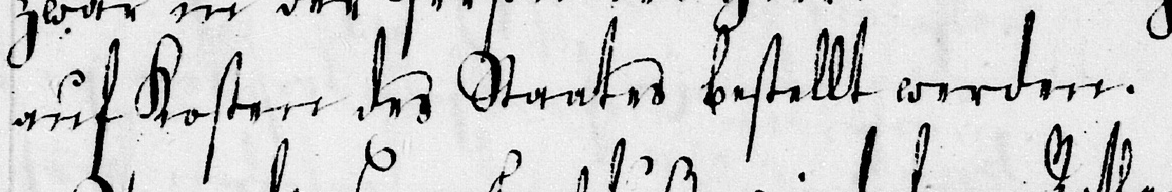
auf Kosten des Staates bestellt werden.
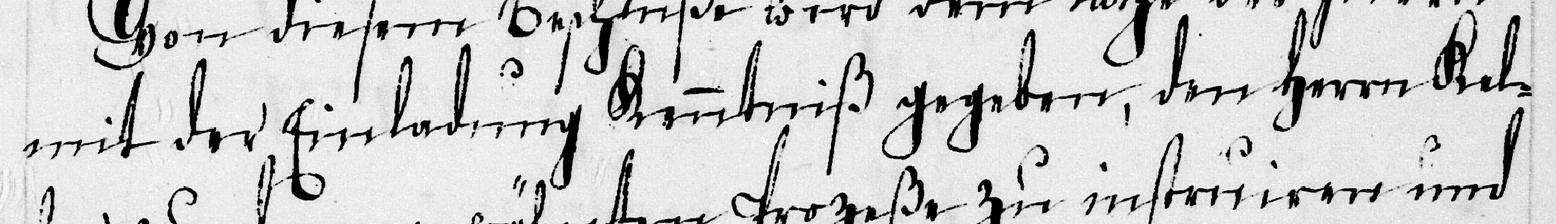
mit der Einladung Kenntniß gegeben, den Herrn Kel¬
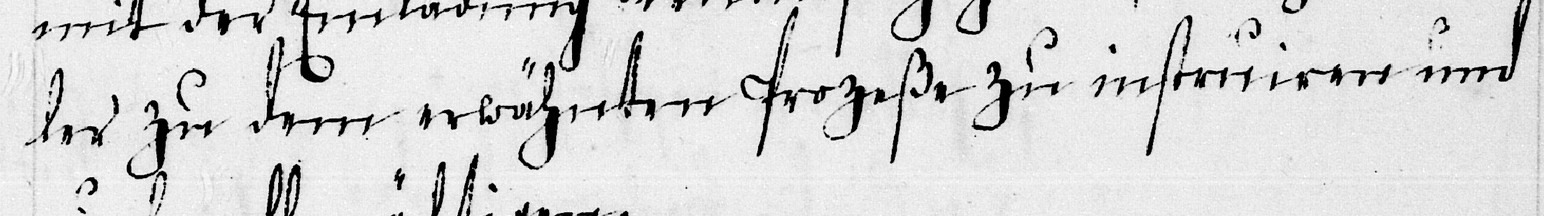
ler zu dem erwähnten Prozeße zu insterniren und
